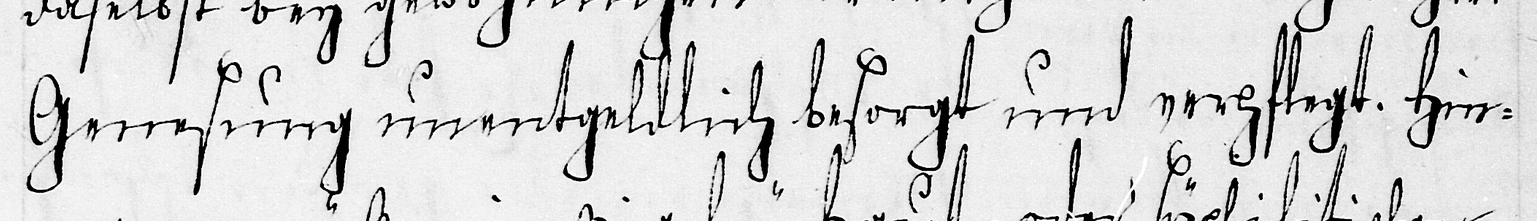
Genesung unentgeldlich besorgt und verpflegt. Hin¬
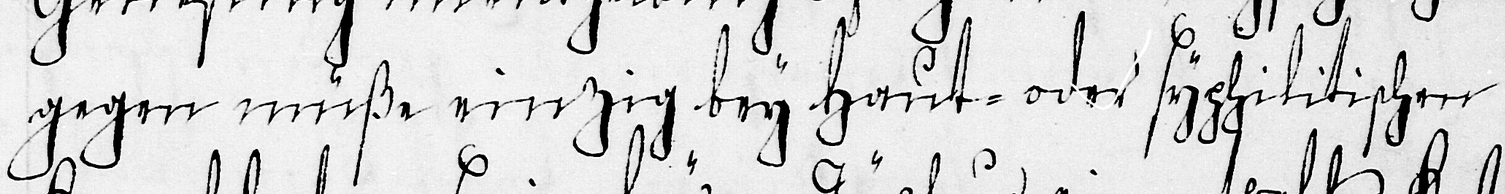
gegen müße einzig bey Haut- oder syphilitischen
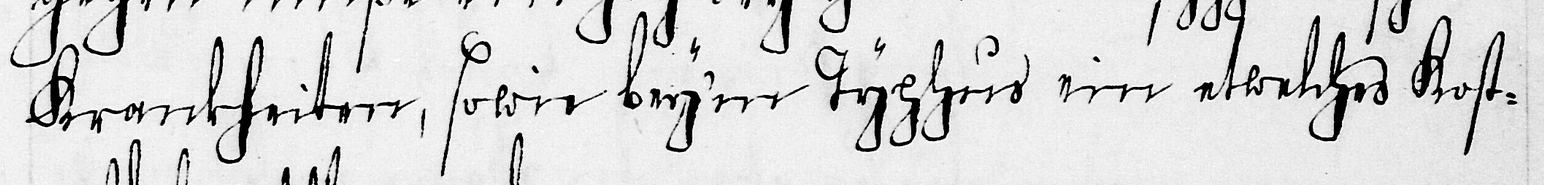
Krankheiten, sowie bey’m Typhus ein etwelches Kost¬
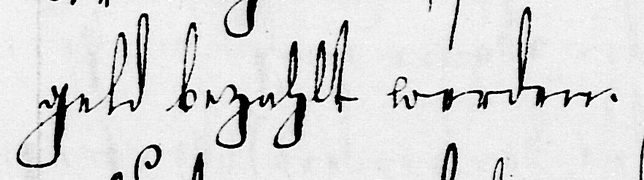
geld bezahlt werden.
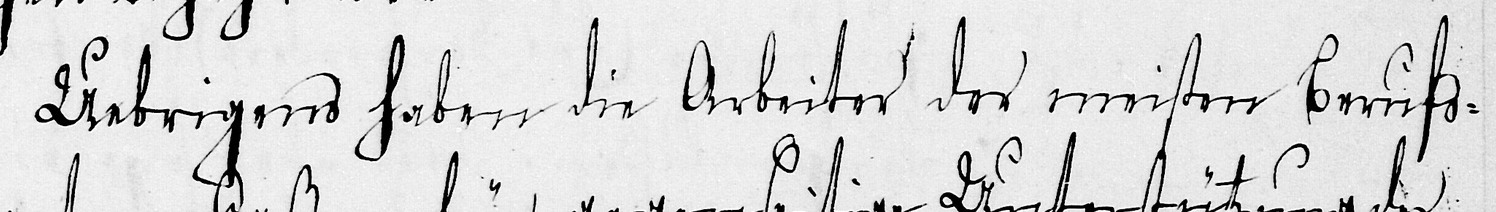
Uebrigens haben die Arbeiter der meisten Berufs¬
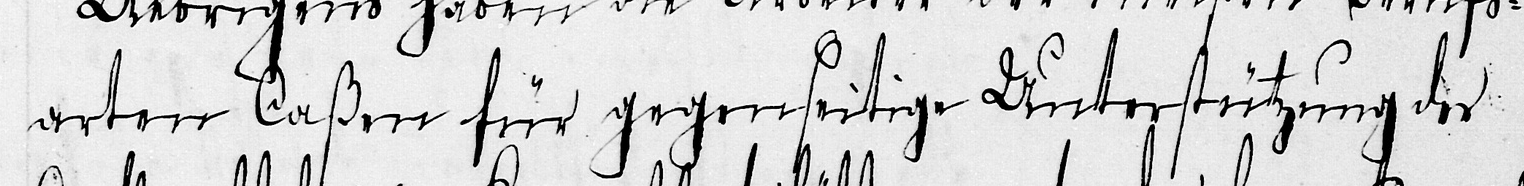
arten Caßen für gegenseitige Unterstützung der
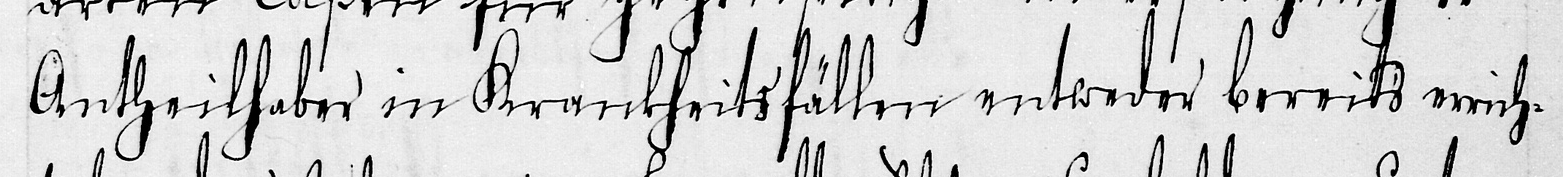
Antheilhaber in Krankheitsfällen entweder bereits errich¬
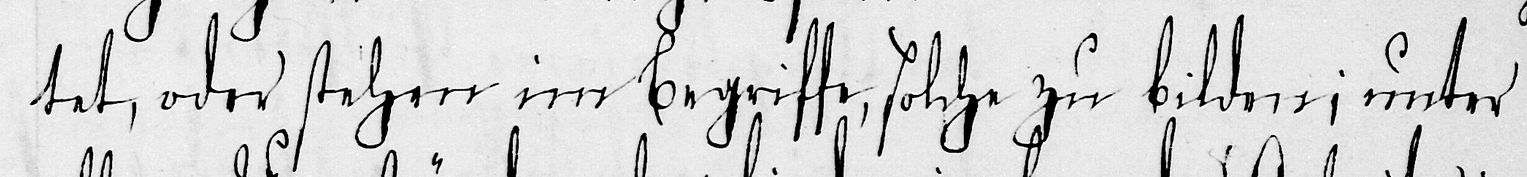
tet, oder stehen im Begriffe, solche zu bilden; unter
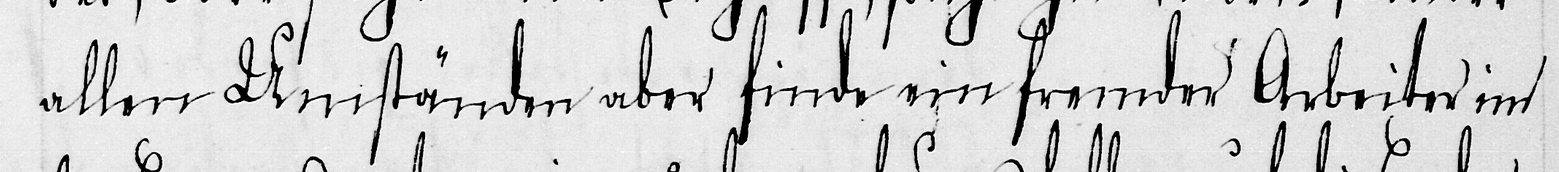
allen Umständen aber finde ein fremder Arbeiter im
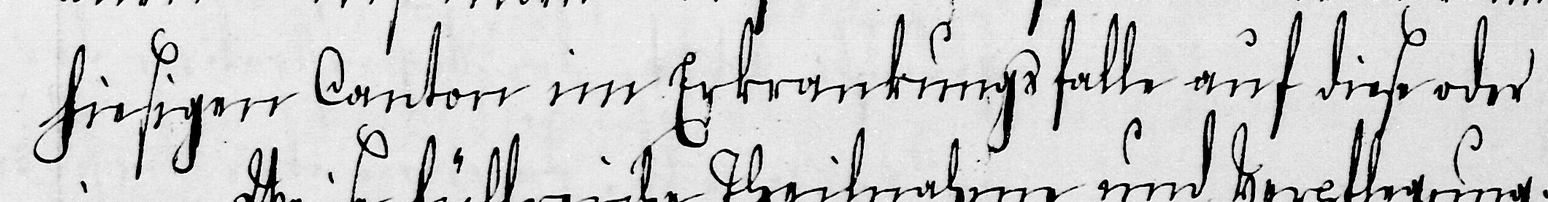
hiesigen Canton im Erkrankungsfalle auf diese oder
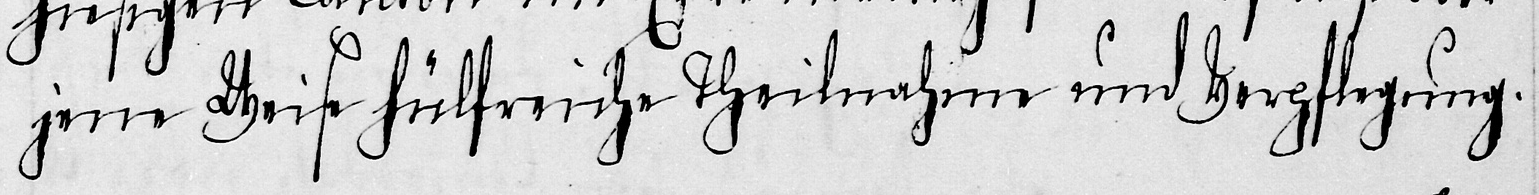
jene Weise hülfreiche Theilnahme und Verpflegung.
